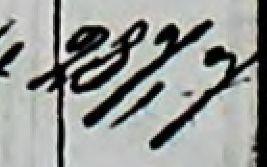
287,7
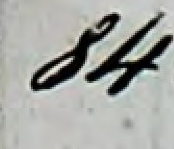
84
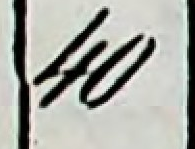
40
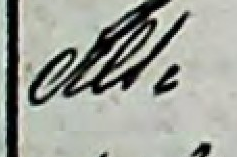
Alt=
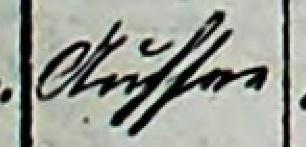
Aussee
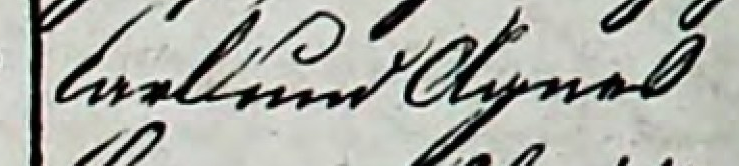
Carl und Agnes
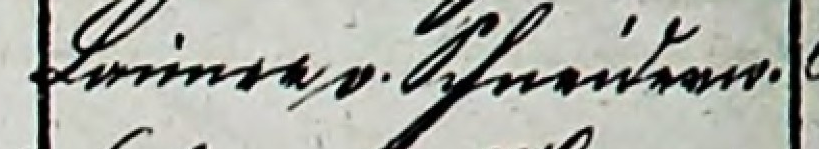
Laimer v, Schneiderw.
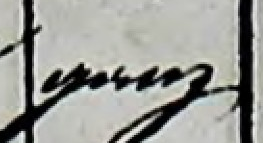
ganz
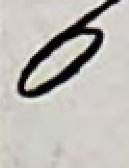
6
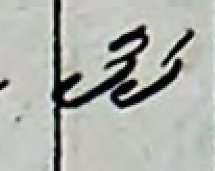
35
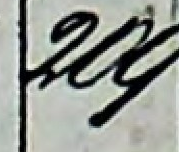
209
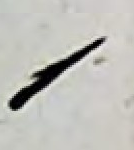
1
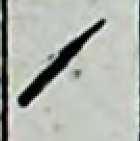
1
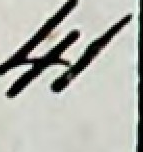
41
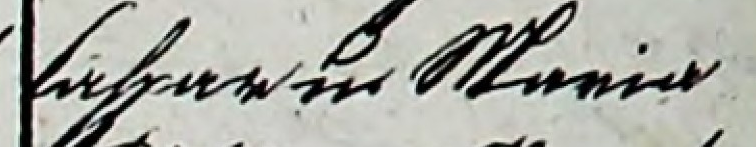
Caspar u. Maria
